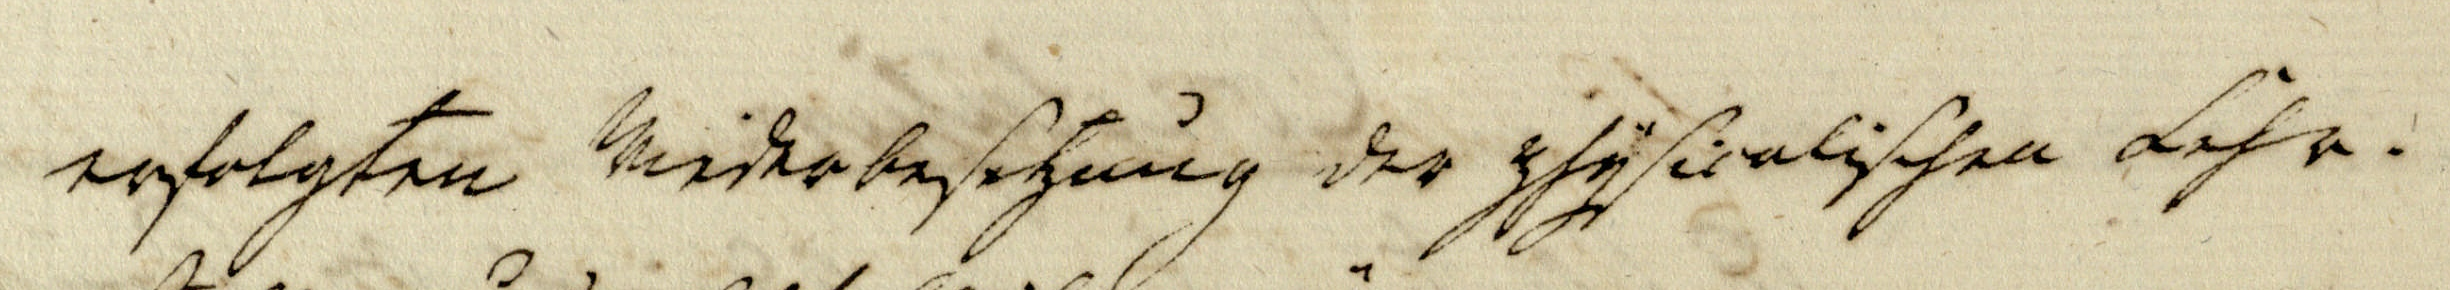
erfolgten Wiederbesetzung der phÿsicalischen Lehr¬
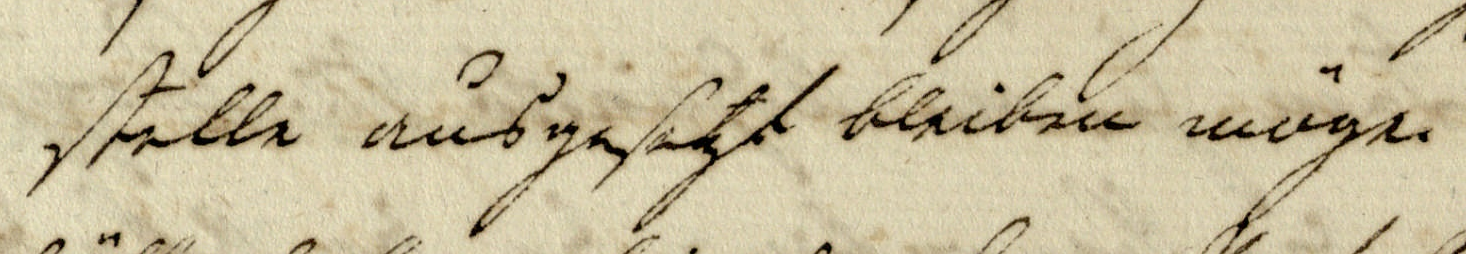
stelle ausgesetzt bleiben möge.
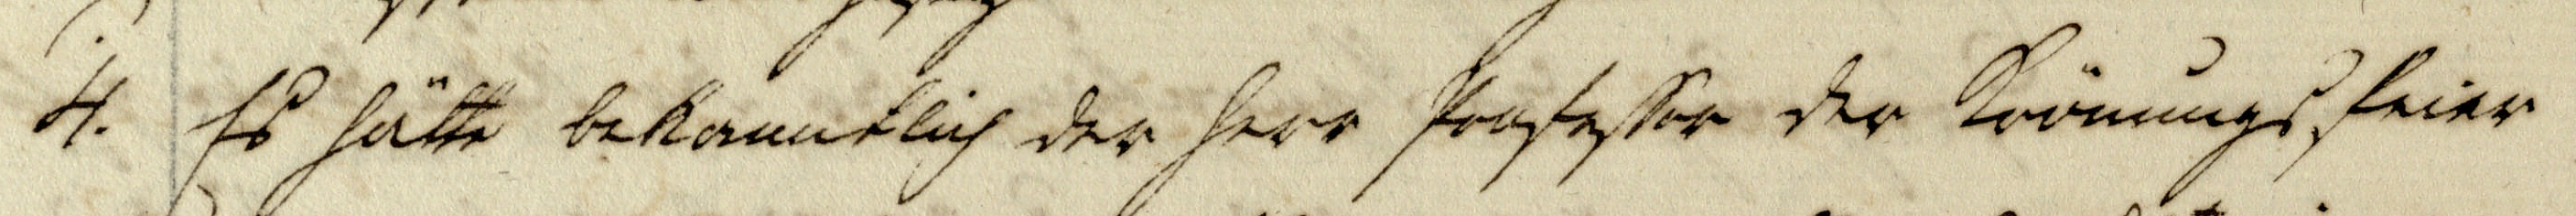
4. Es hätte bekanntlich der Herr Professor der Krönungsfeier
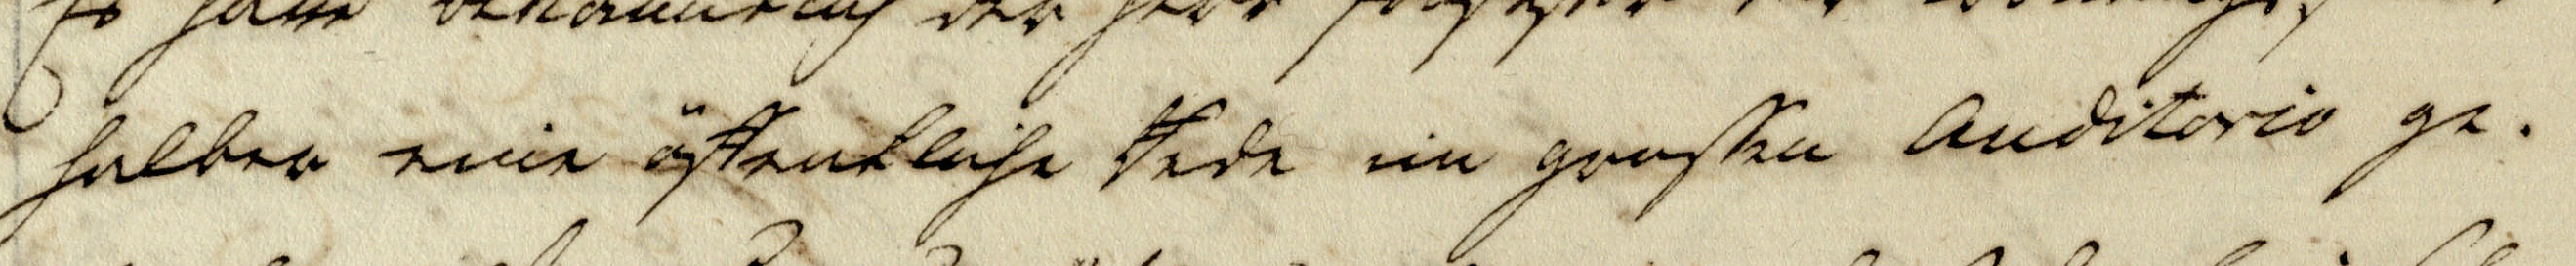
halber eine öffentliche Rede im grossen Auditorio ge¬
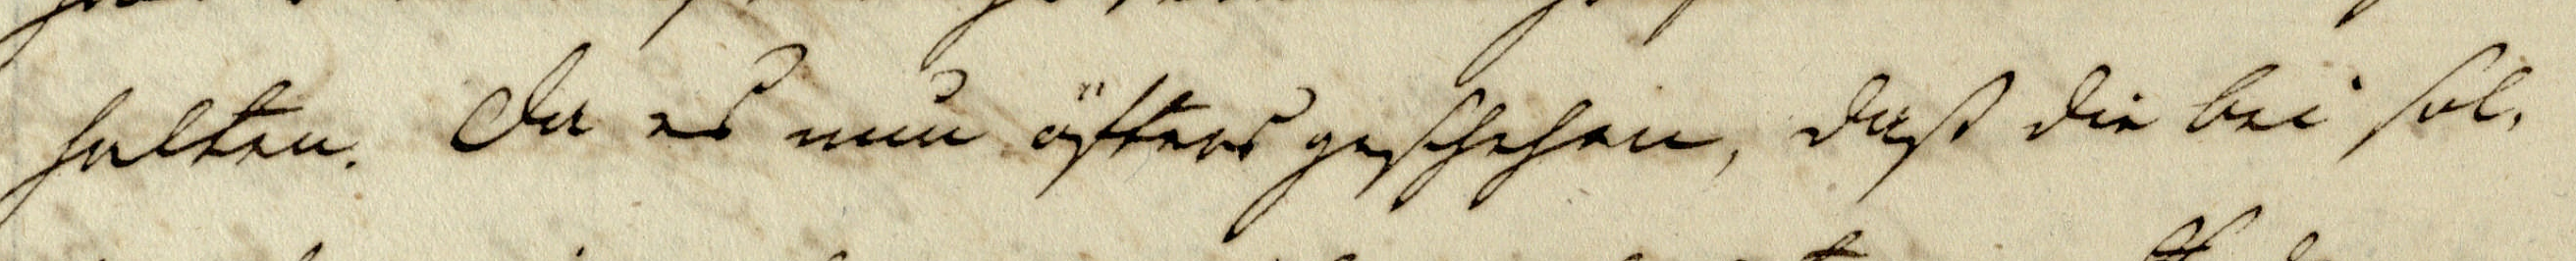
halten. Da es nun öfters geschehen, daß die bei sol¬
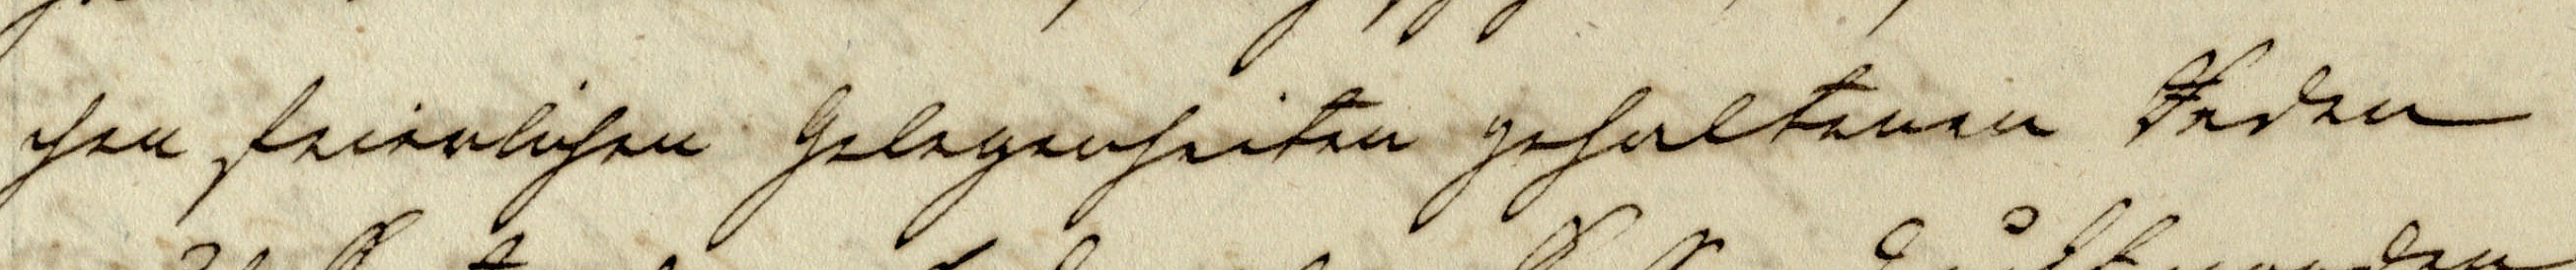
chen feierlichen Gelegenheiten gehaltenen Reden
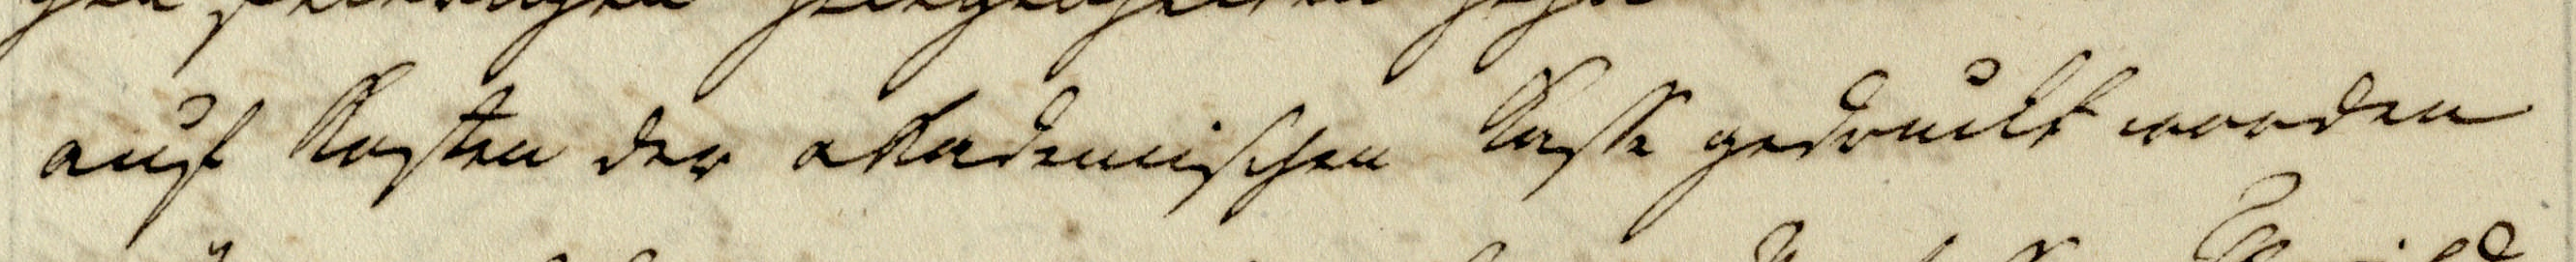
auf Kosten der akademischen Kasse gedruckt worden
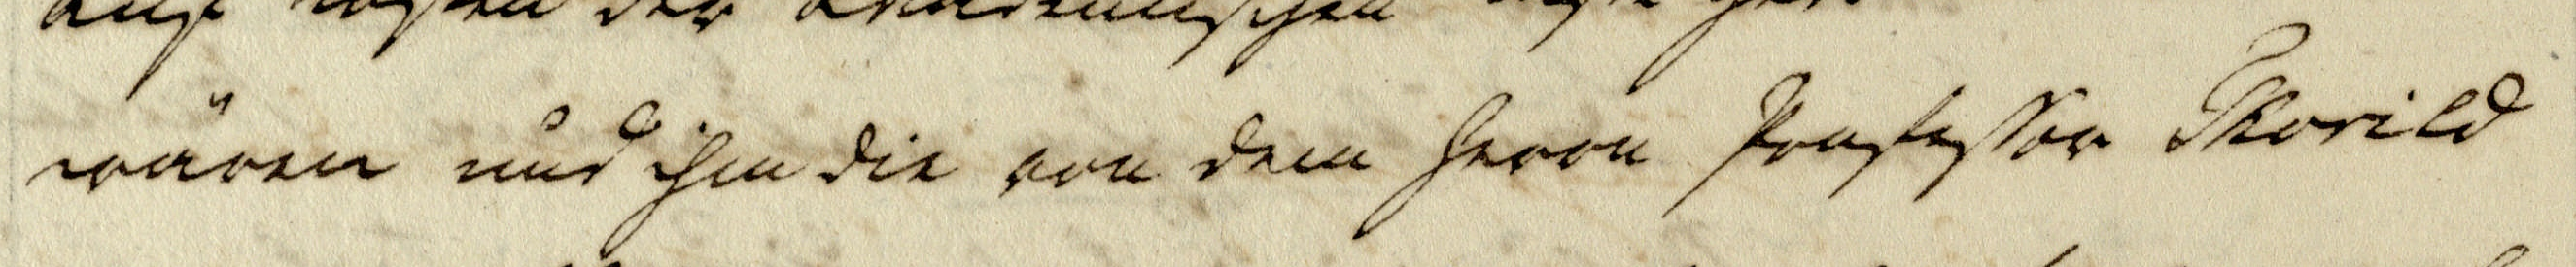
wären und ihm die von dem Herrn Professor Thorild
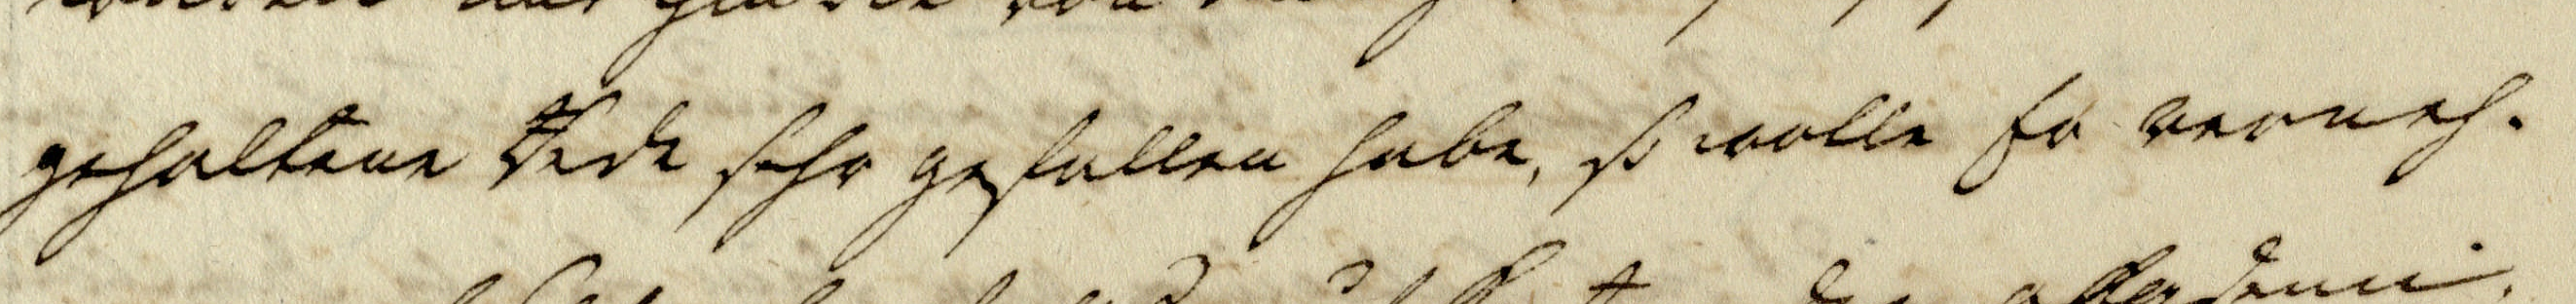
gehaltene Rede sehr gefallen habe, so wolle Er verneh¬
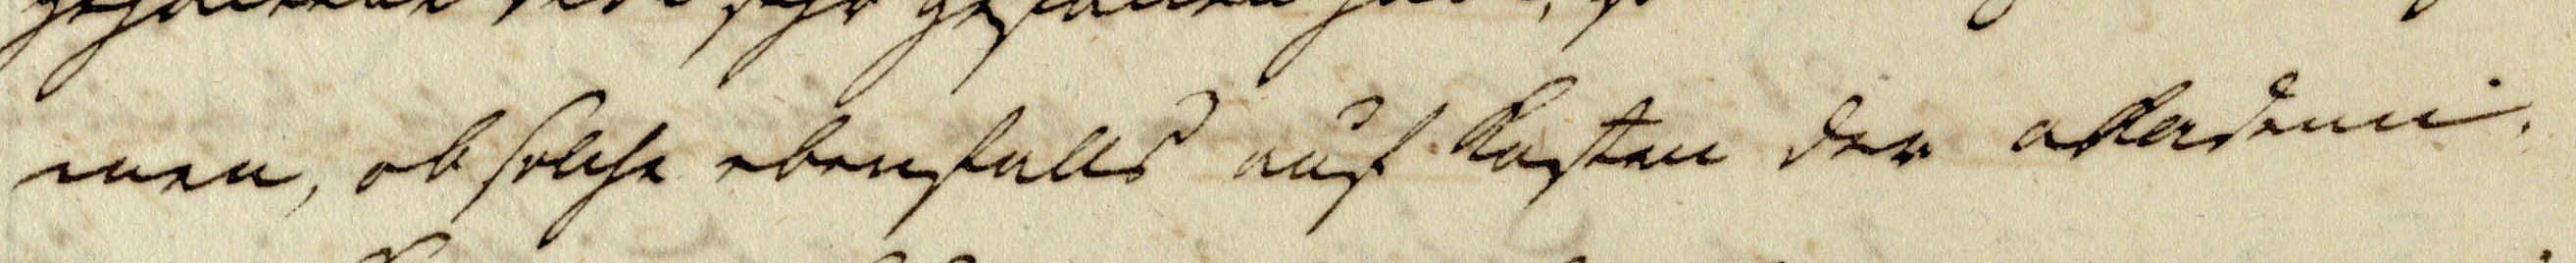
men, ob solche ebenfalls auf Kosten der akademi¬
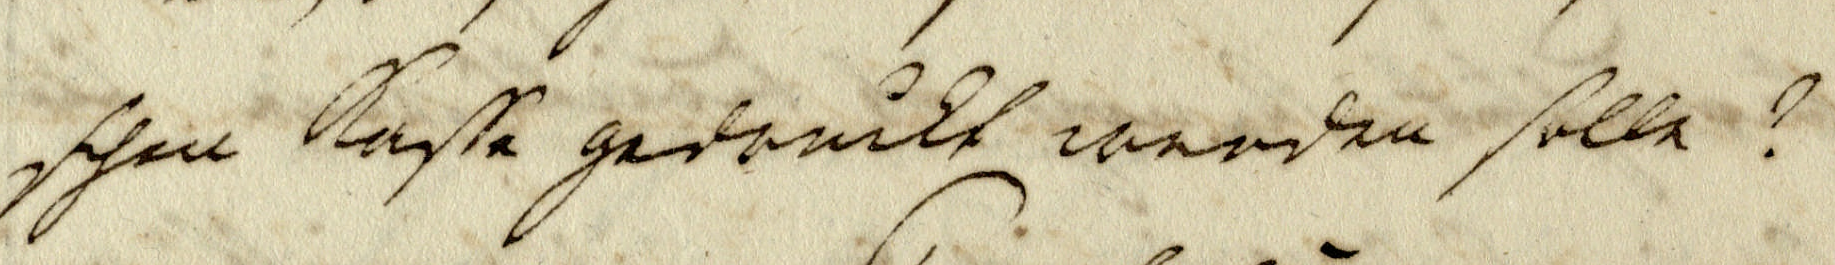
schen Kasse gedruckt werden solle?
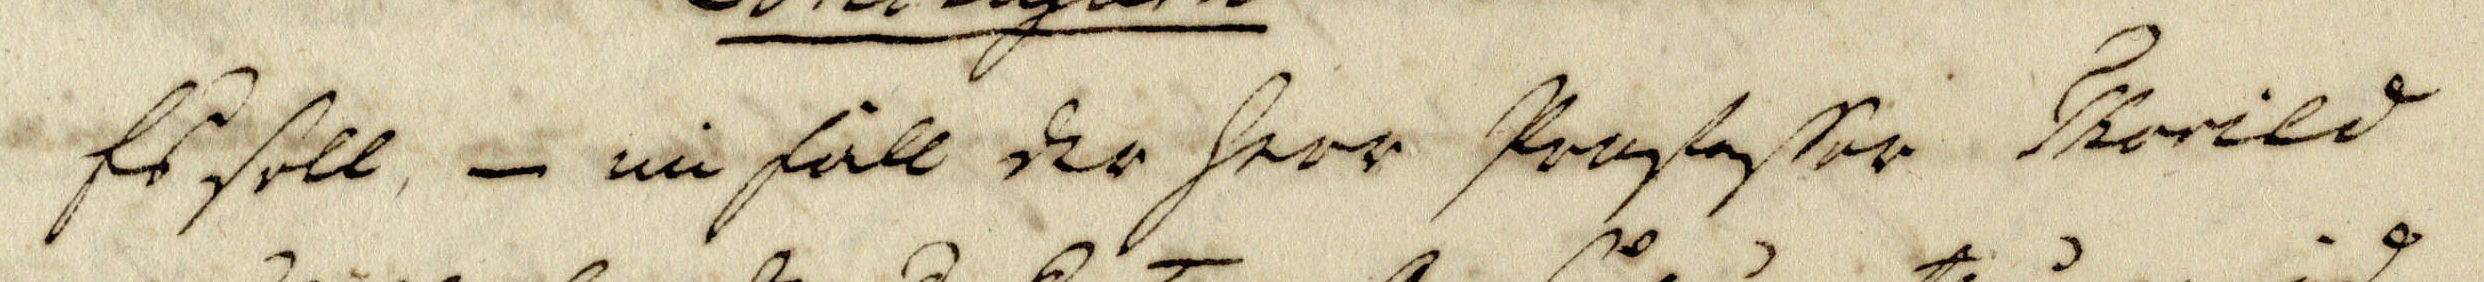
Es soll im Fall der Herr Professor Thorild
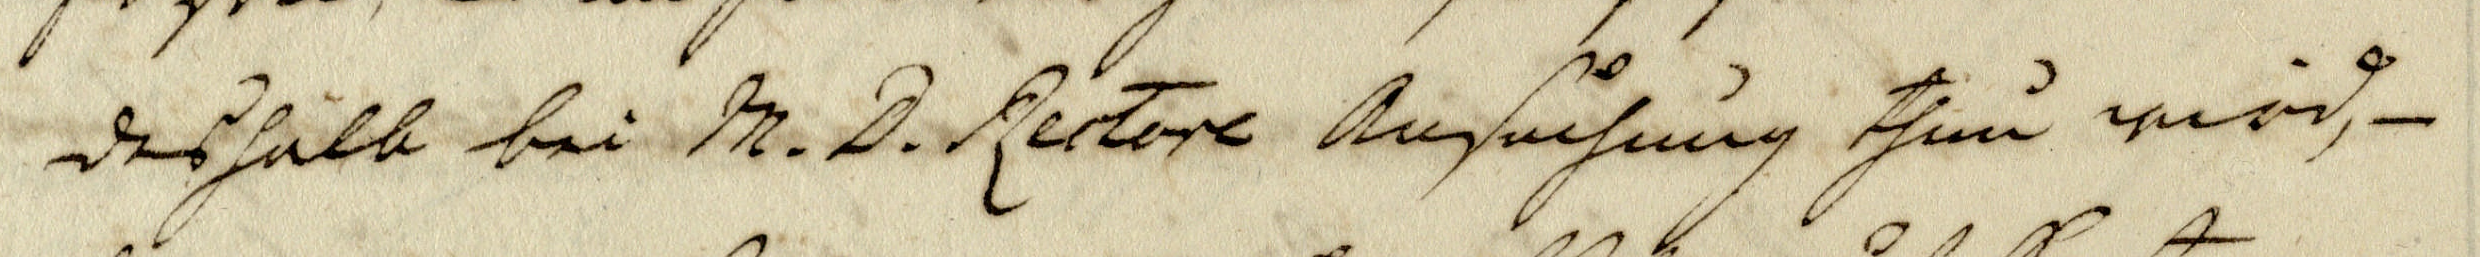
deshalb bei M. D. Rectore Ansuchung thun wird,
